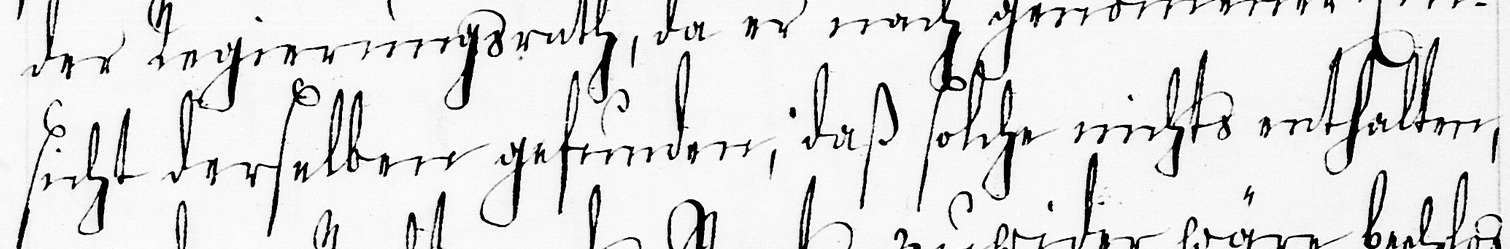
sicht derselben gefunden, daß solche nichts enthalten,
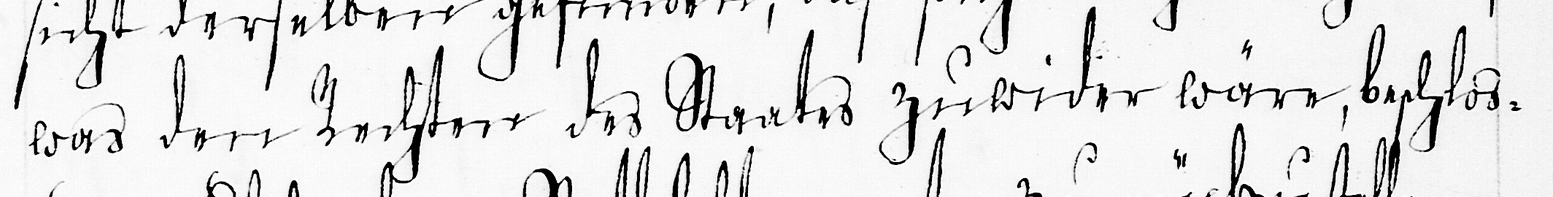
was den Rechten des Staates zuwider wäre, beschloß¬
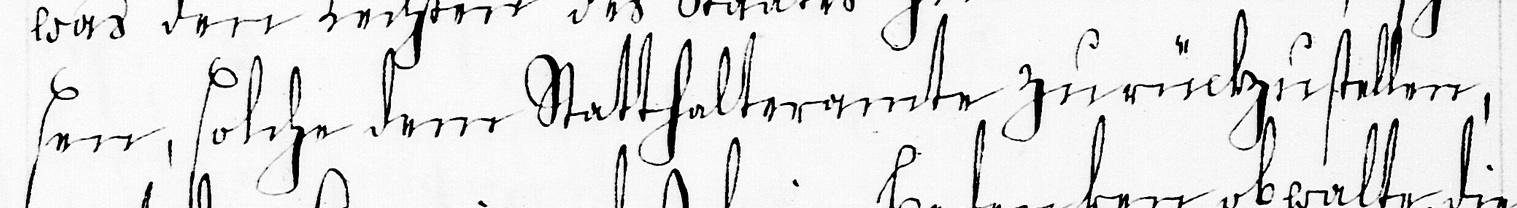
en, solche dem Statthalteramte zurückzustellen,
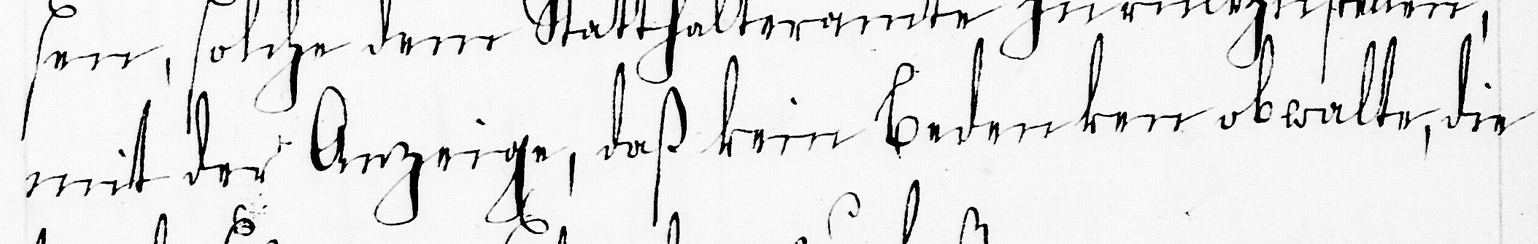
mit der Anzeige, daß kein Bedenken obwalte, die
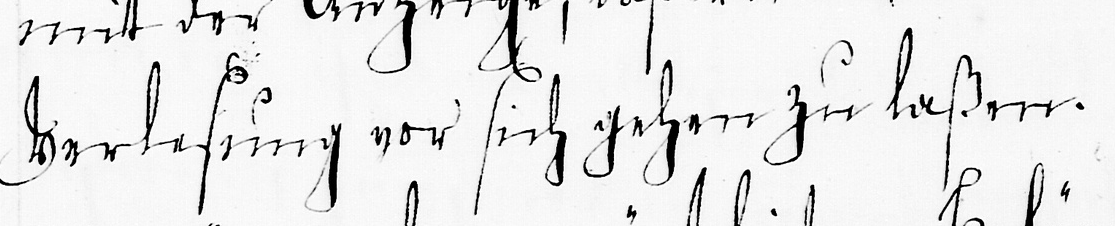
Verlesung vor sich gehen zu laßen.
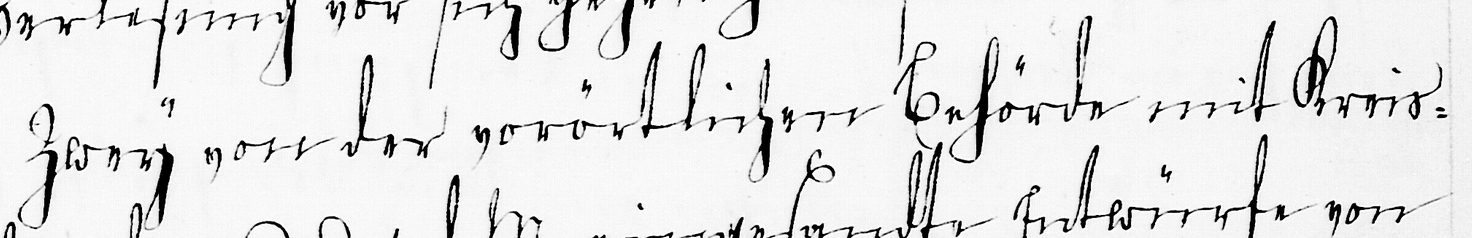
Zwey von der vorörtlichen Behörde mit Kreis¬
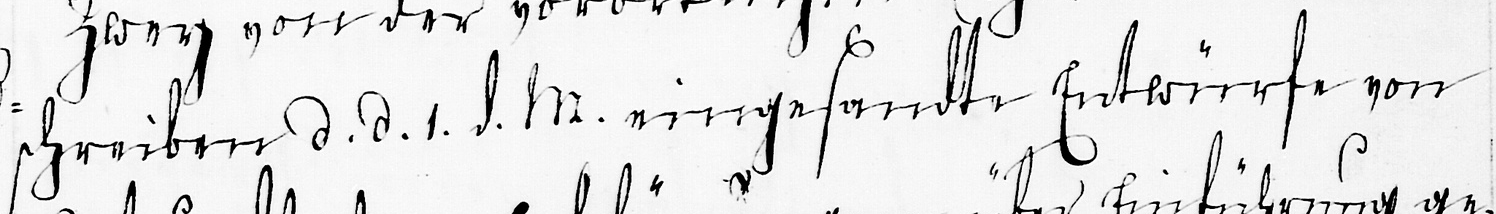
schreiben d. d. 1. d. M. eingesandte Entwürfe von
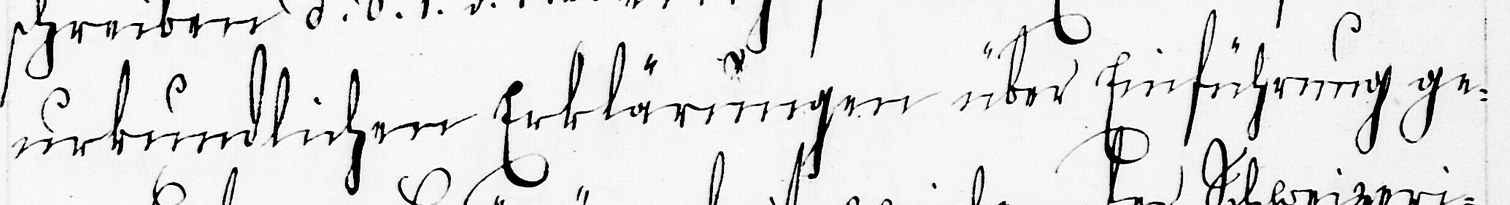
urkundlichen Erklärungen über Einführung ge¬
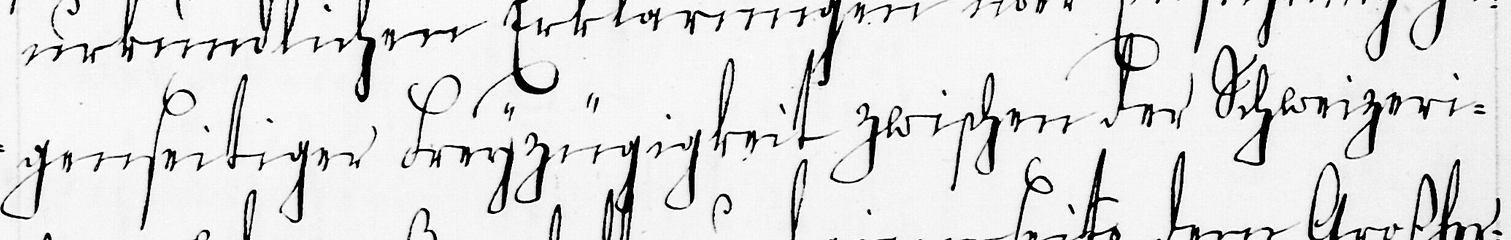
genseitiger Freyzügigkeit zwischen der Schweizeri¬
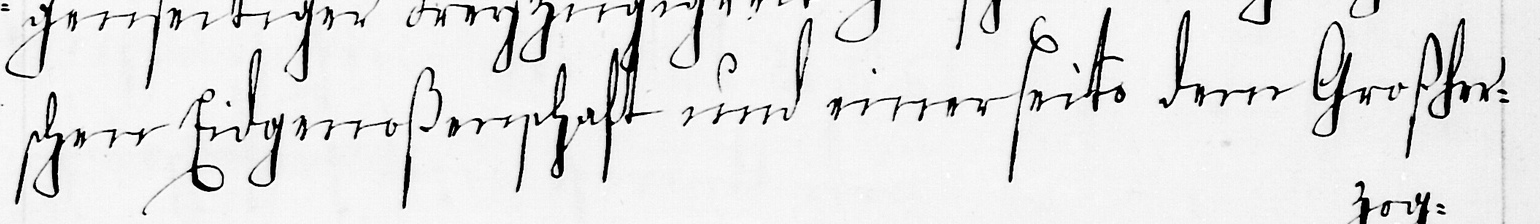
schen Eidgenoßenschaft und einerseits dem Großher-
